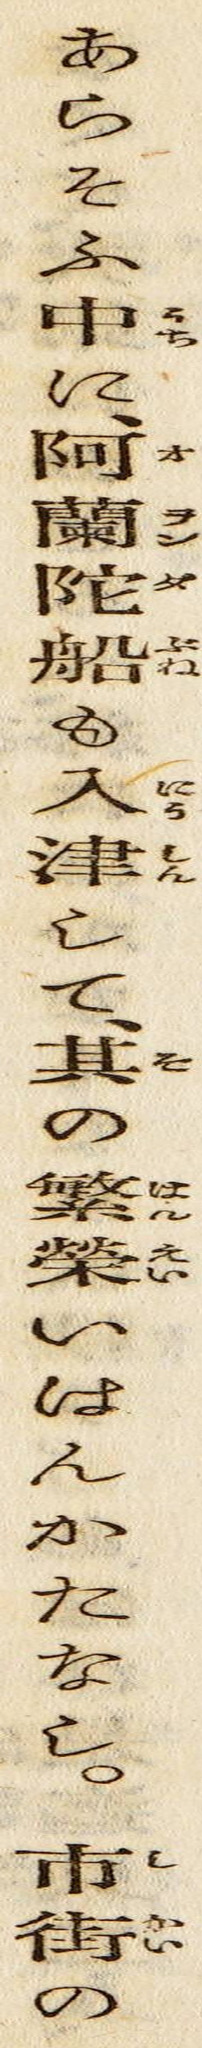あらそふ中に、阿蘭陀船も入津して、其の繁栄いはんかたなし。市街の
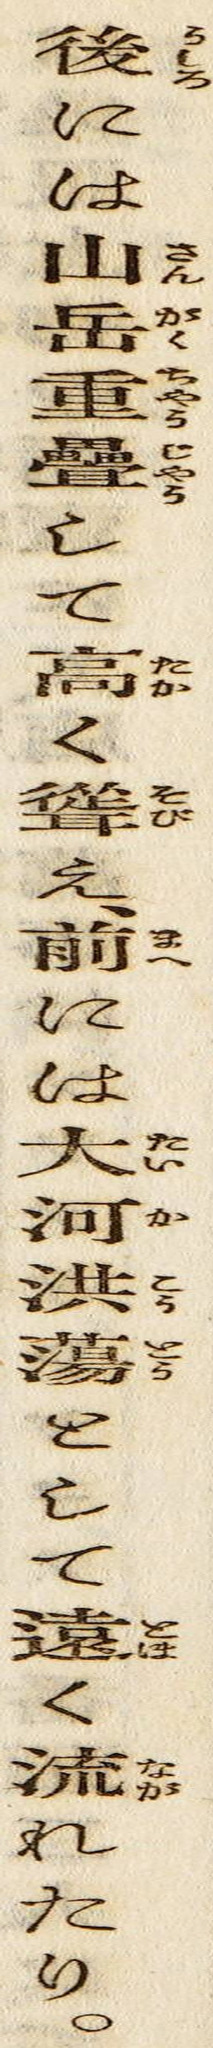後には山岳重畳して高く聳え、前には大河洪蕩として遠く流れたり。
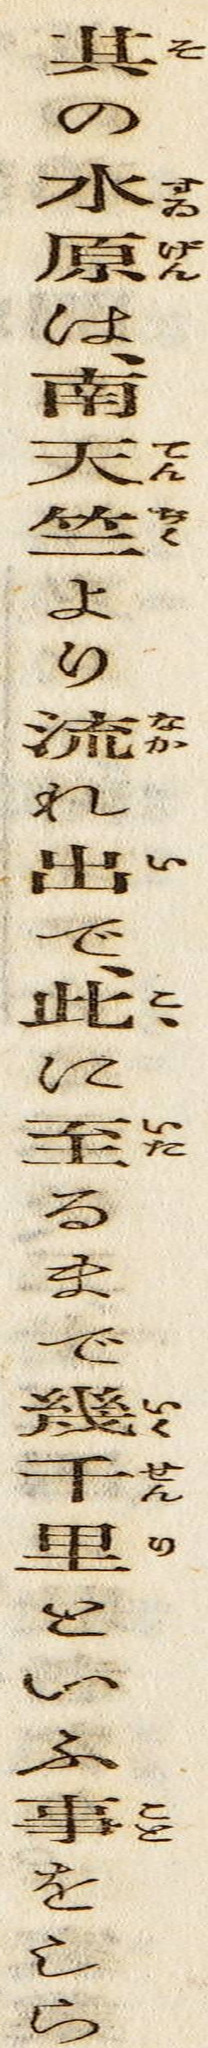其の水原は、南天竺より流れ出で、此に至るまで幾千里といふ事をしら
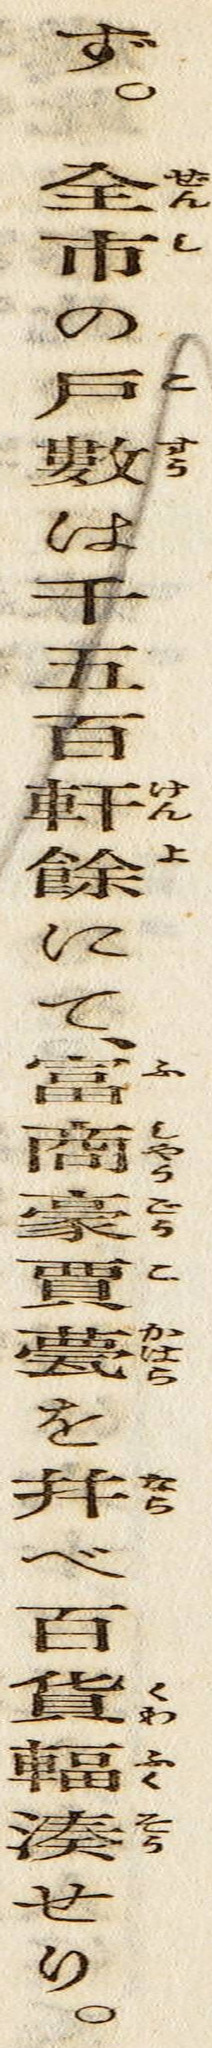ず。全市の戸数は千五百軒余にて、富商豪賈甍を并べ百貨輻湊せり。
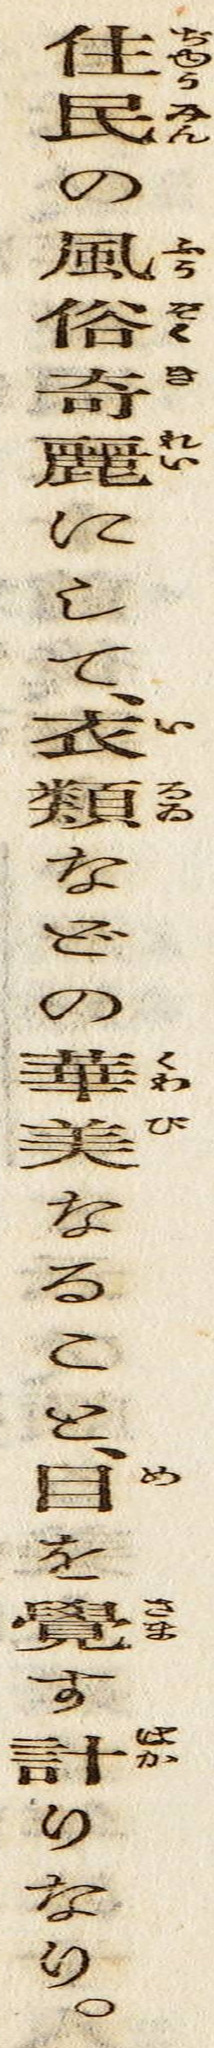住民の風俗奇麗にして、衣類などの華美なること、目を覚す計りなり。
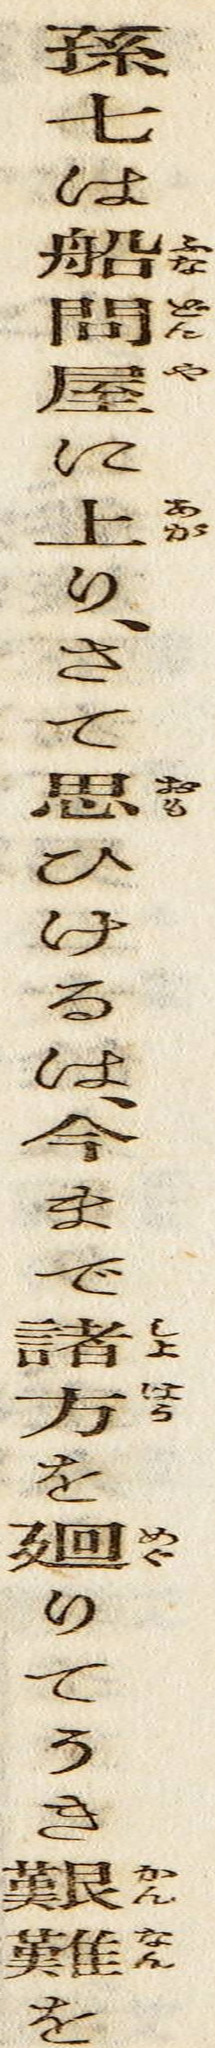孫七は船問屋に上り、さて思ひけるは、今まで諸方を廻りてうき艱難を
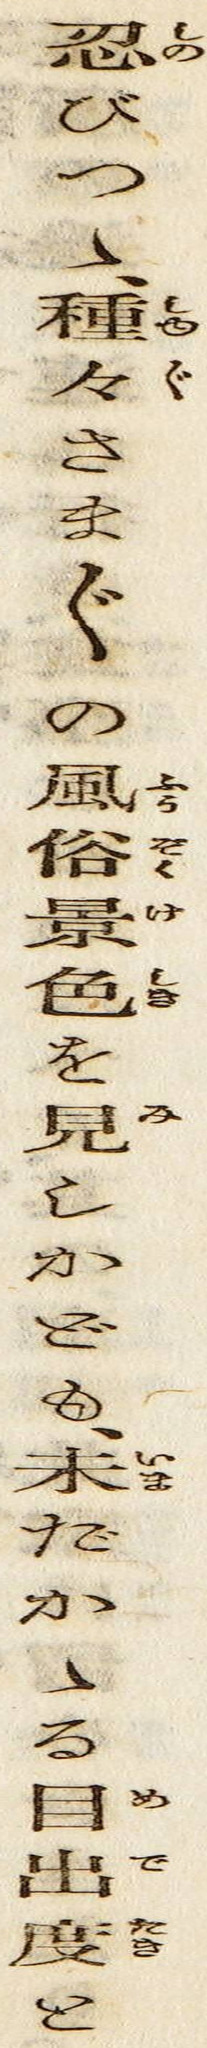忍びつゝ、種々さま〴〵の風俗景色を見しかども、未だかゝる目出度と
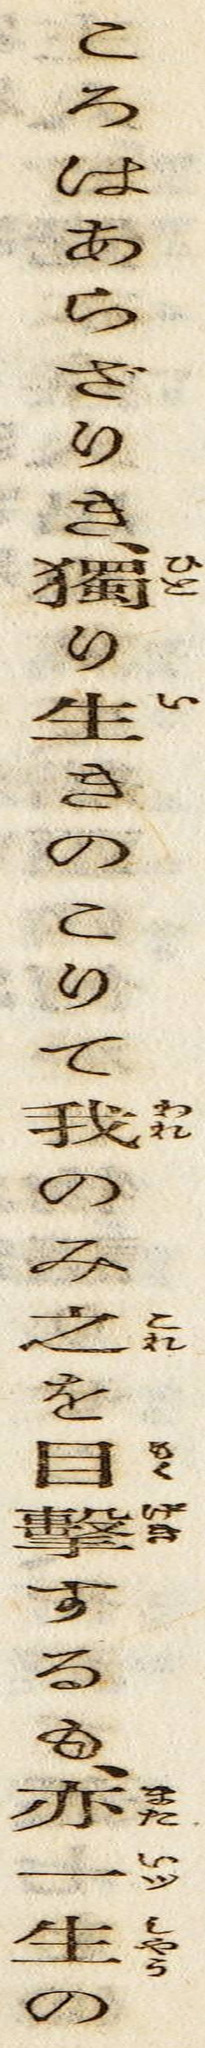ころはあらざりき、独り生きのこりて我のみ之を目撃するも、亦一生の
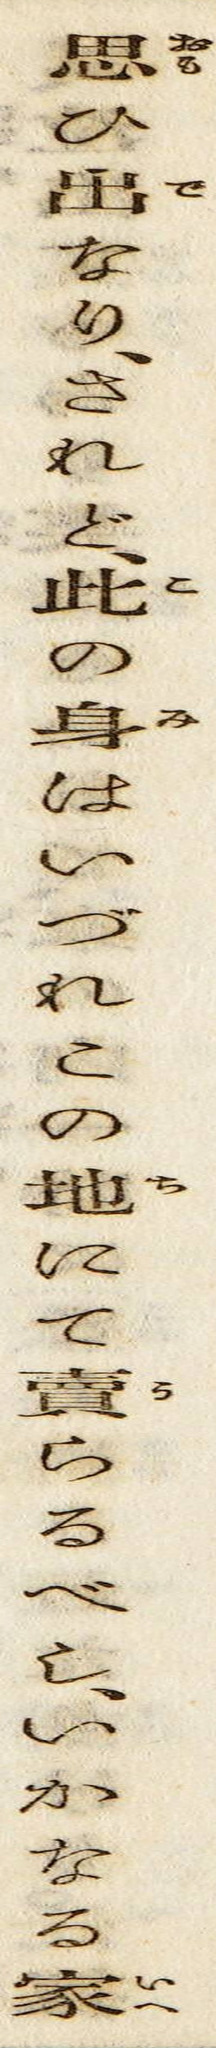思ひ出なり、されど、此の身はいづれこの地にて売らるべし、いかなる家
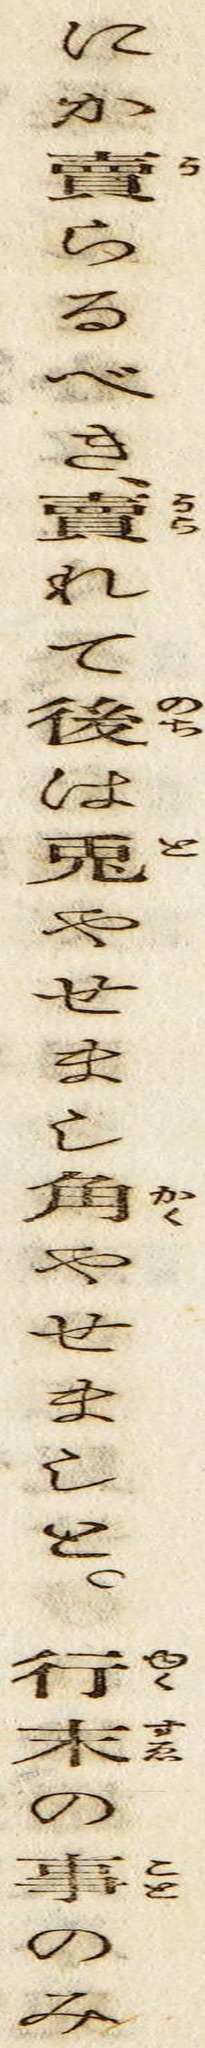にか売らるべき、売れて後は兎やせまし角やせましと。行末の事のみ
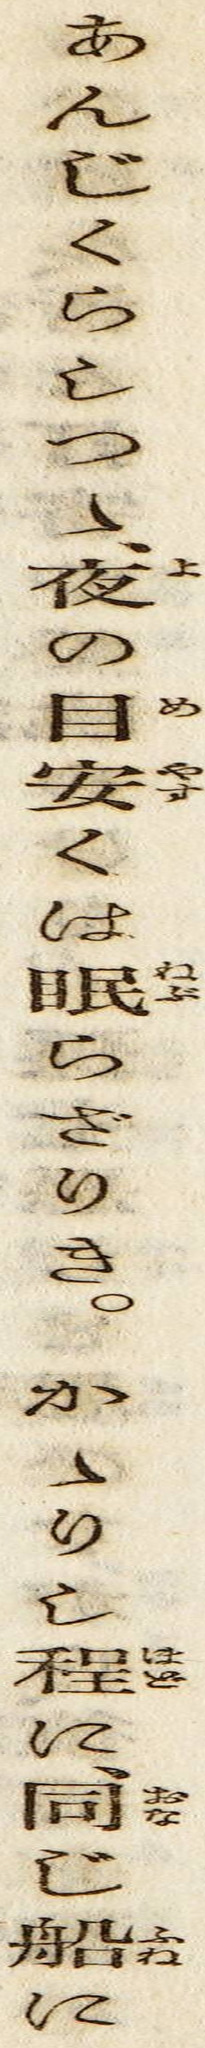あんじくらしつゝ、夜の目安くは眠らざりき。かゝりし程に、同じ船に
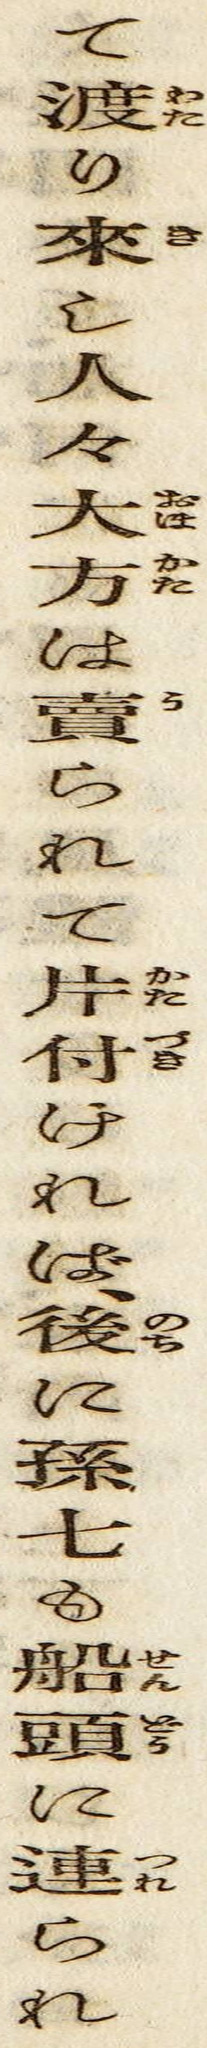て渡り来し人々大方は売られて片付ければ、後に孫七も船頭に連られ

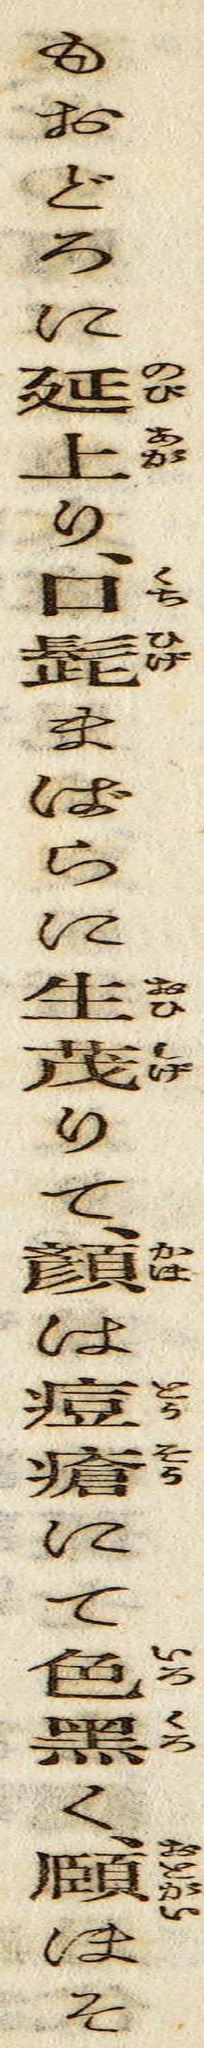もおどろに延上り、口髭まばらに生茂りて、顔は痘瘡にて色黒く、頤ほそ
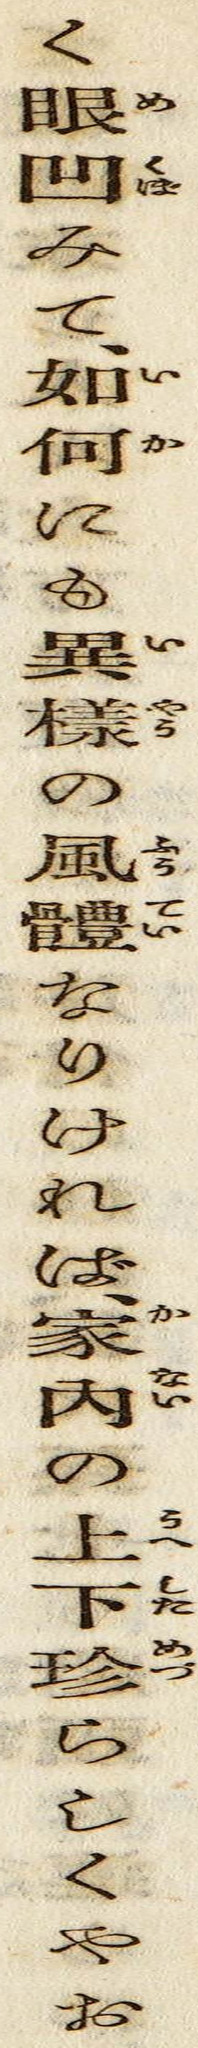く眼凹みて、如何にも異様の風体なりければ、家内の上下珍らしくやお
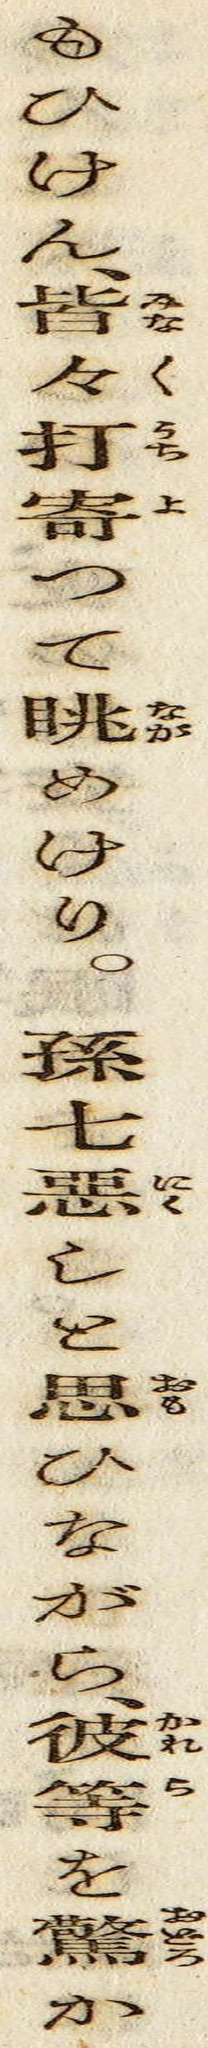もひけん、皆々打寄つて眺めけり。孫七悪しと思ひながら、彼等を驚か
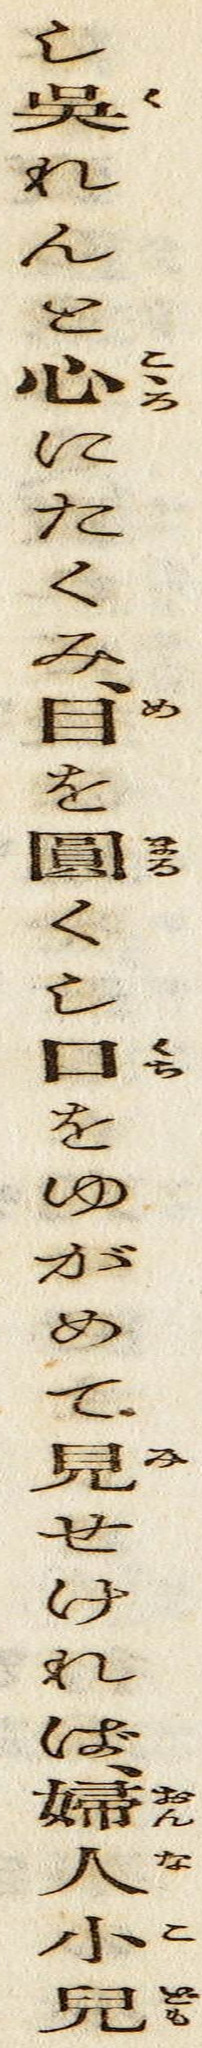し呉れんと心にたくみ、目を円くし口をゆがめて見せければ、婦人小児
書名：日本漂流譚
